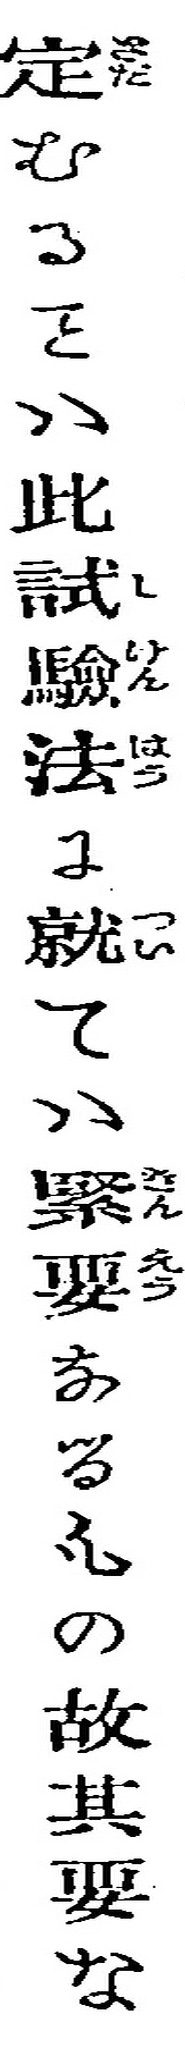定むることは此試験法に就ては緊要なるもの故其要な
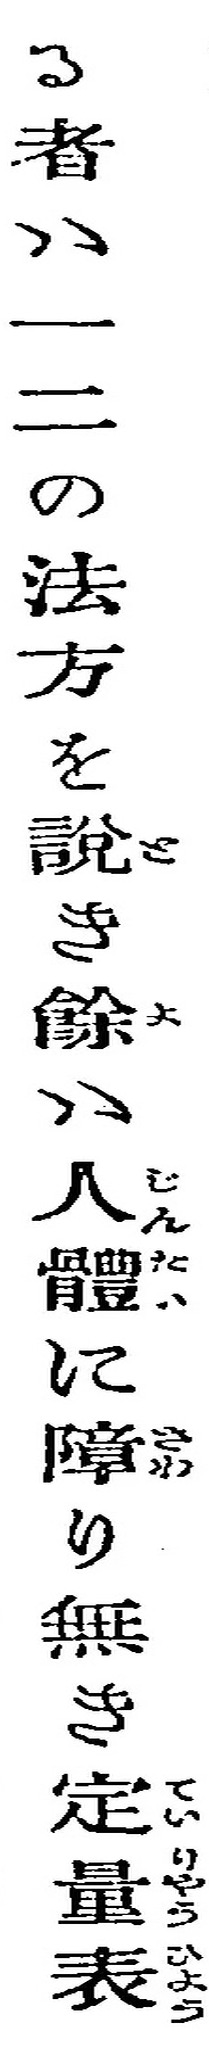る者は一二の法方を説き餘は人體に障り無き定量表
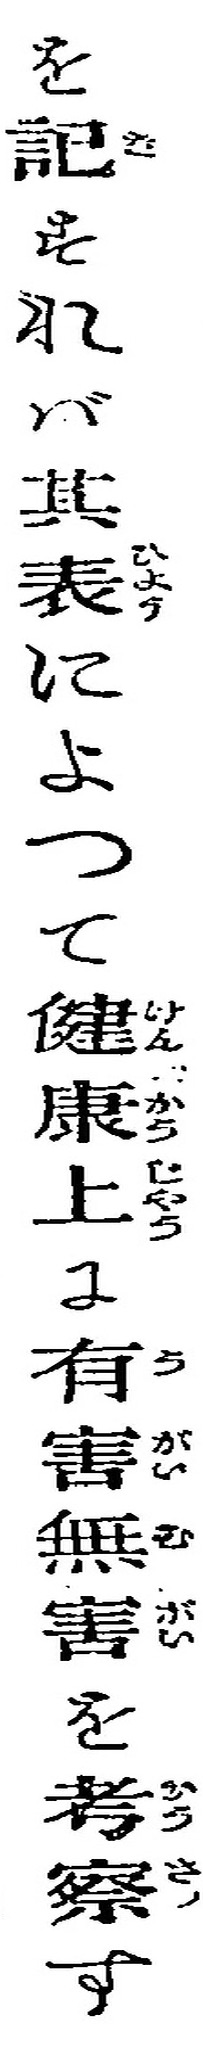を記すれば其表によつて健康上に有害無害を考察す
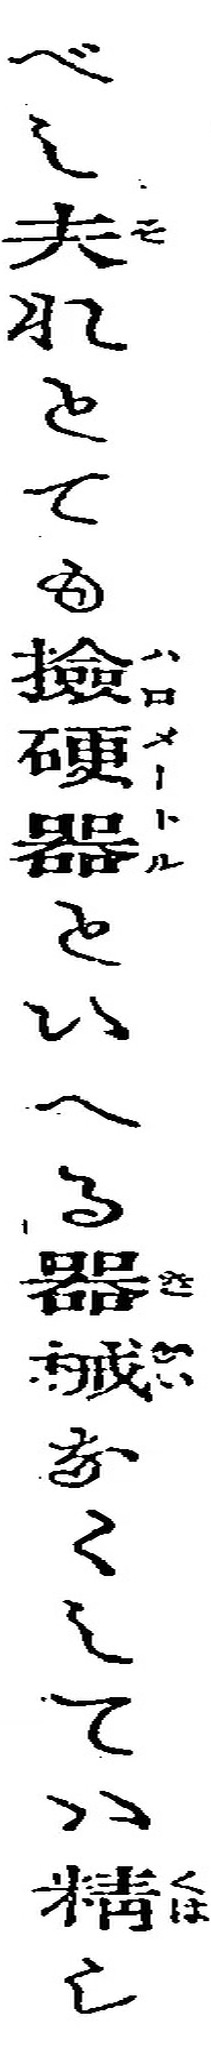べし夫れとても撿硬器といへる器械なくしては精し
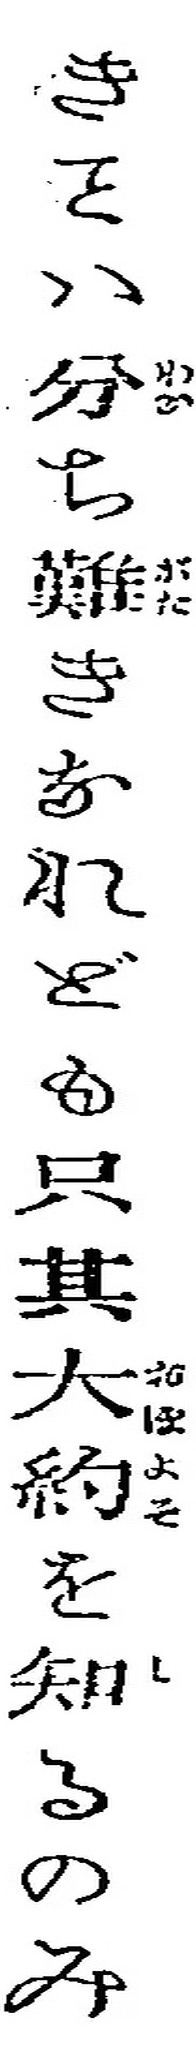きことは分ち難きなれども只其大約を知るのみ
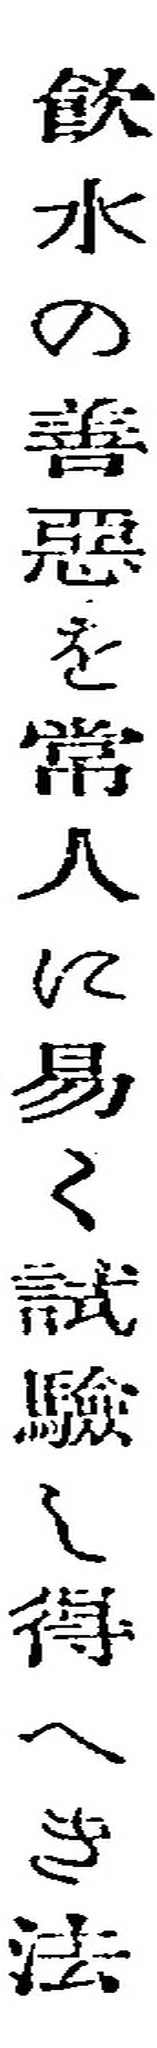飲水の善悪を常人に易く試験し得へき法
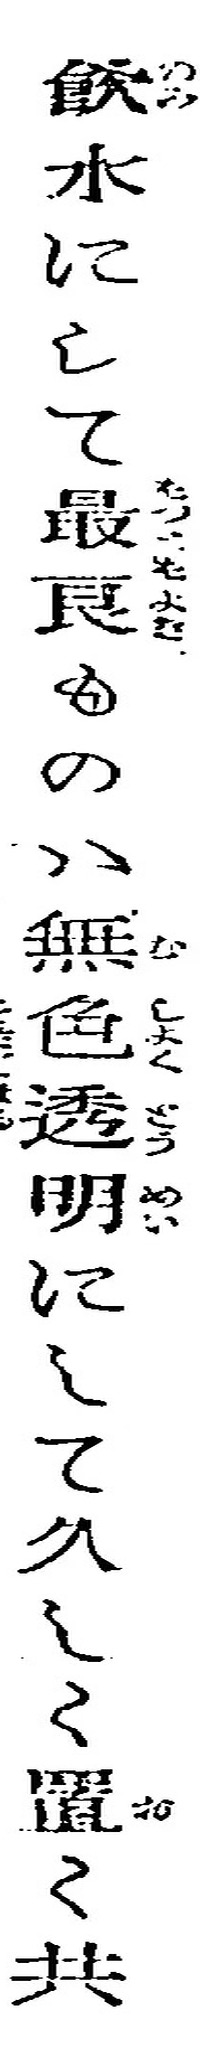飲水にして最良ものは無色透明にして久しく置く共
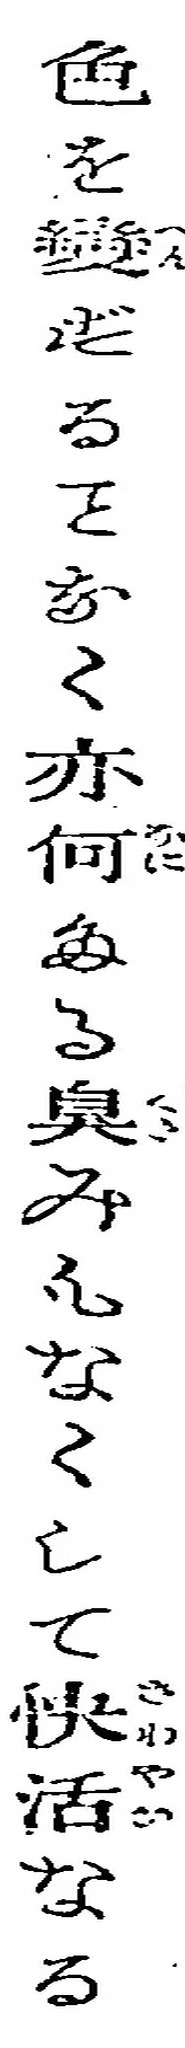色を變ずることなく亦何たる臭みもなくして快活なる
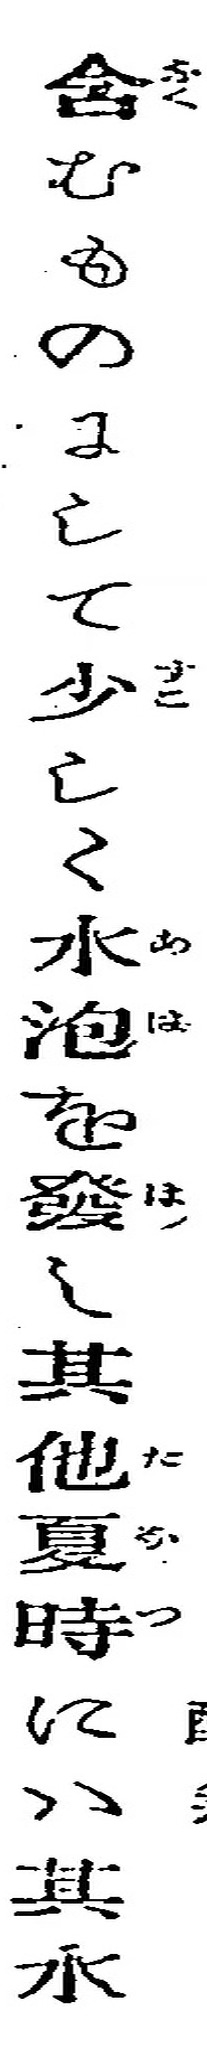含むものにして少しく水疱を發し其他夏時には其水
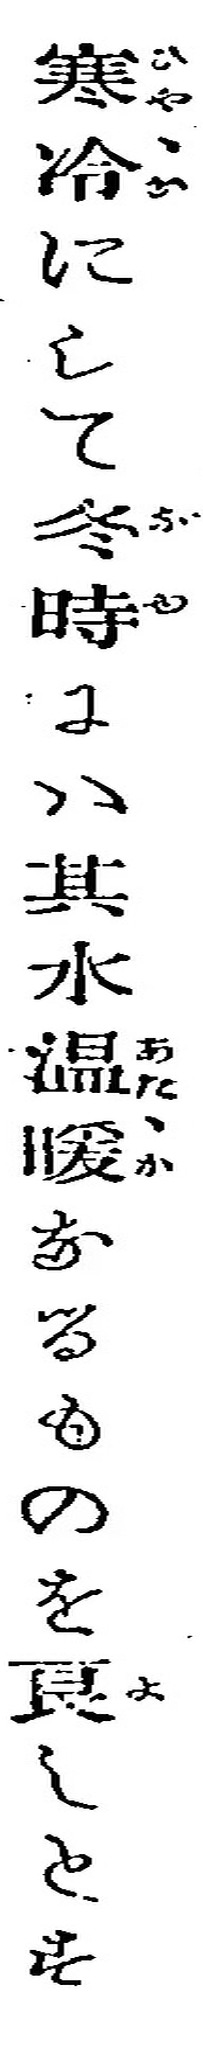寒冷にして冬時には其水温暖なるものを良しとす
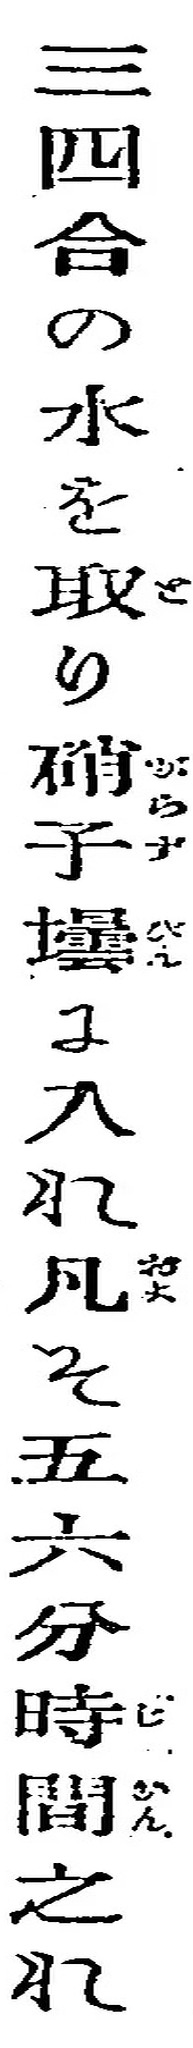三四合の水を取り硝子壜に入れ凡そ五六分時間之れ
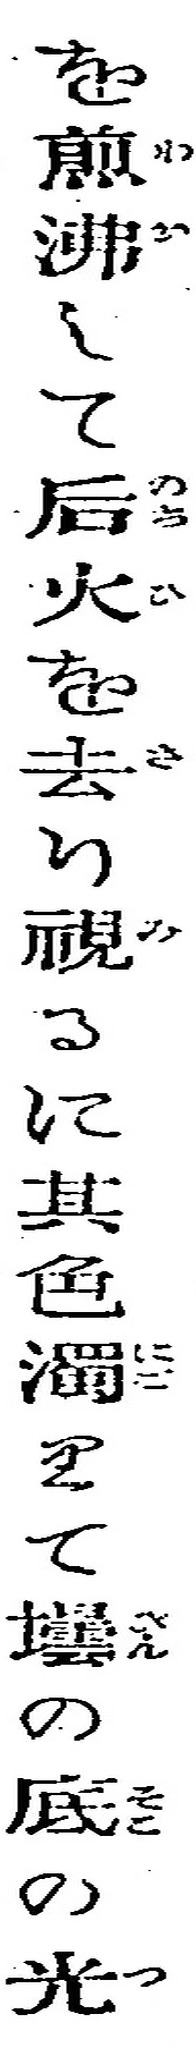を煎沸して后火を去り視るに其色濁りて壜の底の光
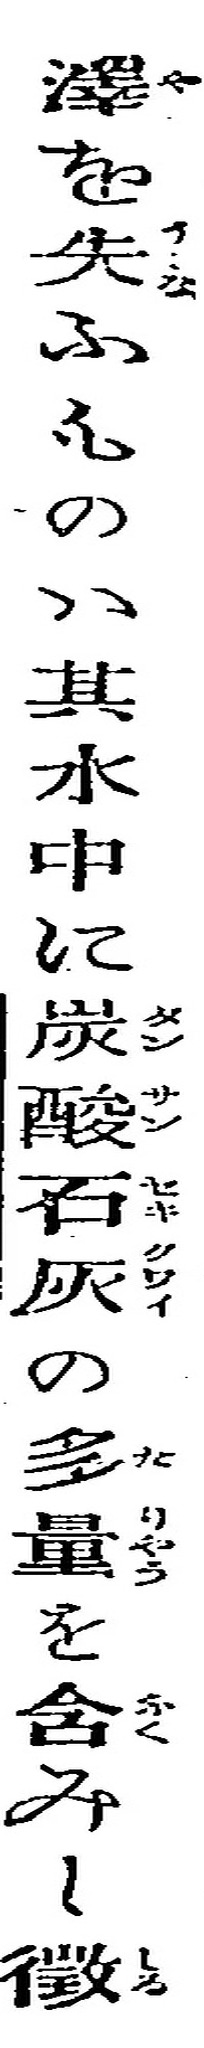沢を失ふものは其水中に炭酸石灰の多量を含みし徴

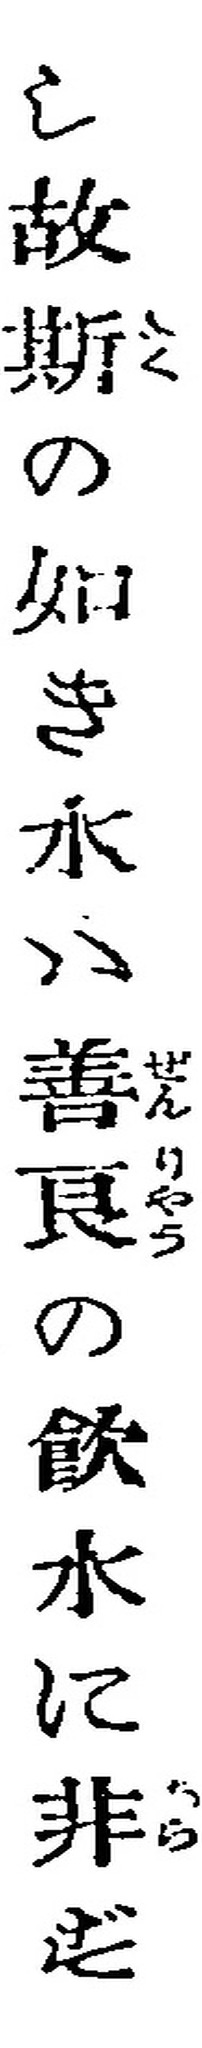し故斯の如き水は善良の飲水に非ず
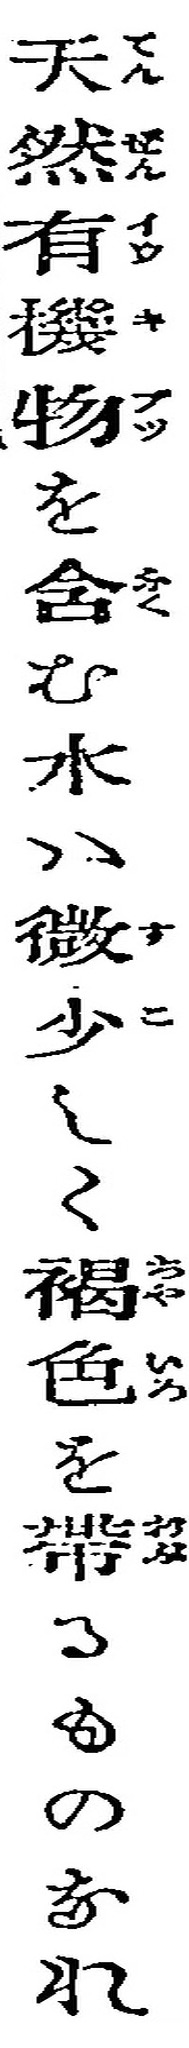天然有機物を含む水は微少しく褐色を帯るものなれ
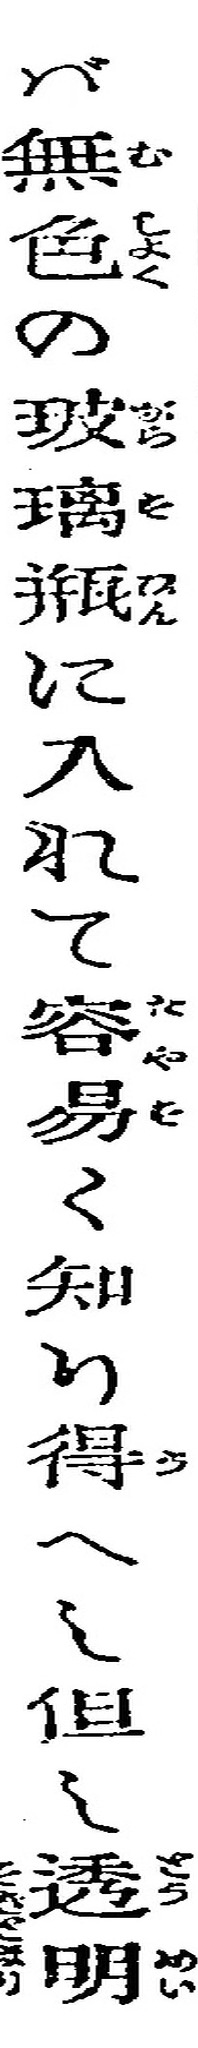ば無色の玻璃瓶に入れて容易く知り得へし但し透明
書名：飲水の心得 : 伝染病の予防
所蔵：国立国会図書館 National Diet Library, JAPAN
